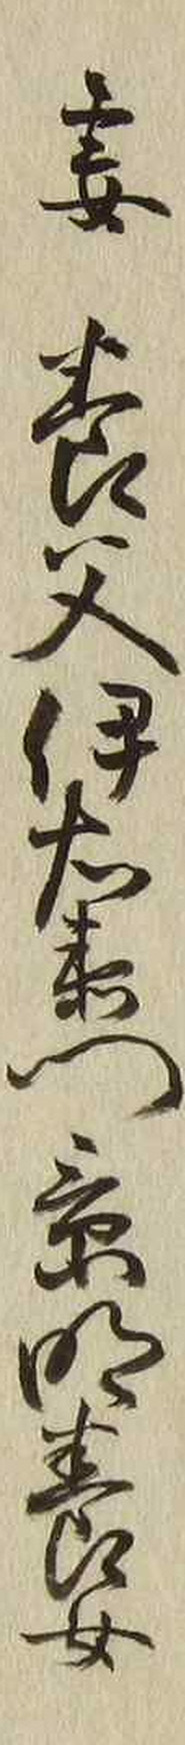妻養父伊右衛門景明養女
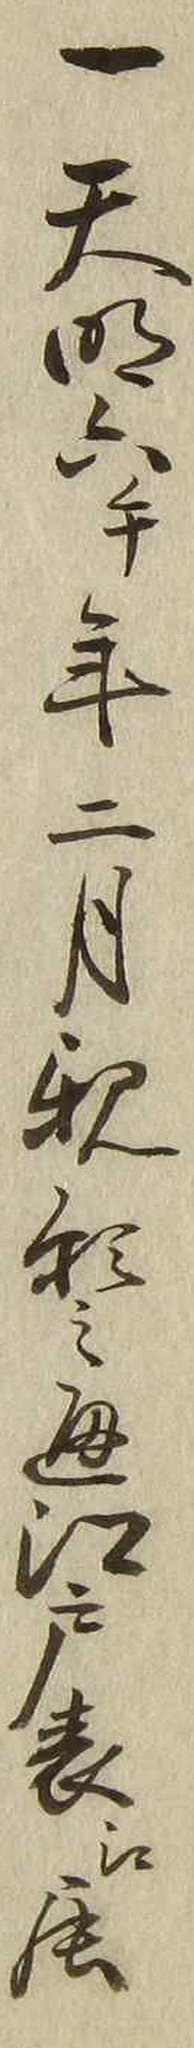一天明六午年二月親願之通江戸表江罷
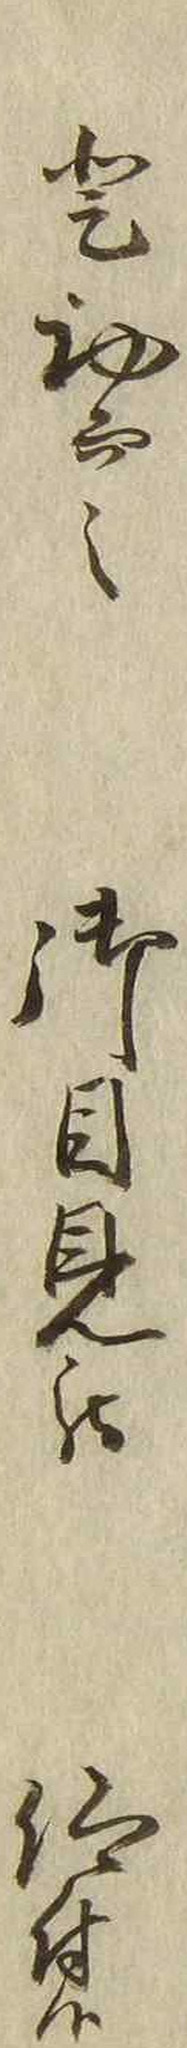登初而之御目見被仰付候

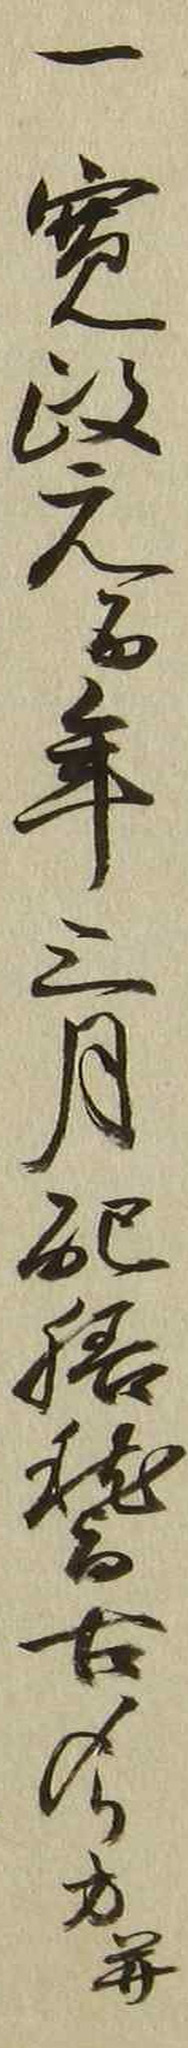一寛政元酉年三月配膳稽古〆り方幷
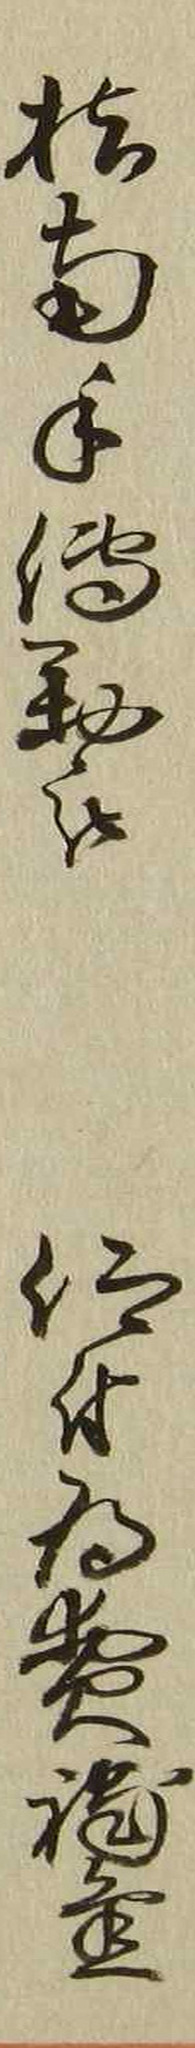指南手伝勤被仰付為費補金
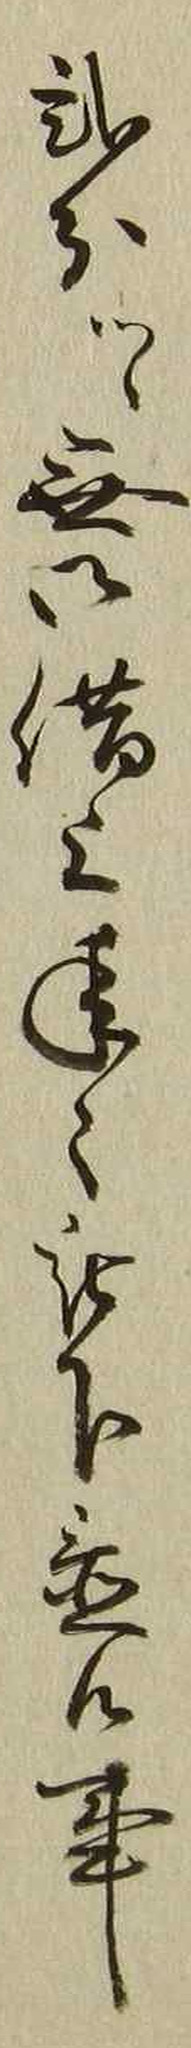弐分ツヽ無御借上年々被下置候事
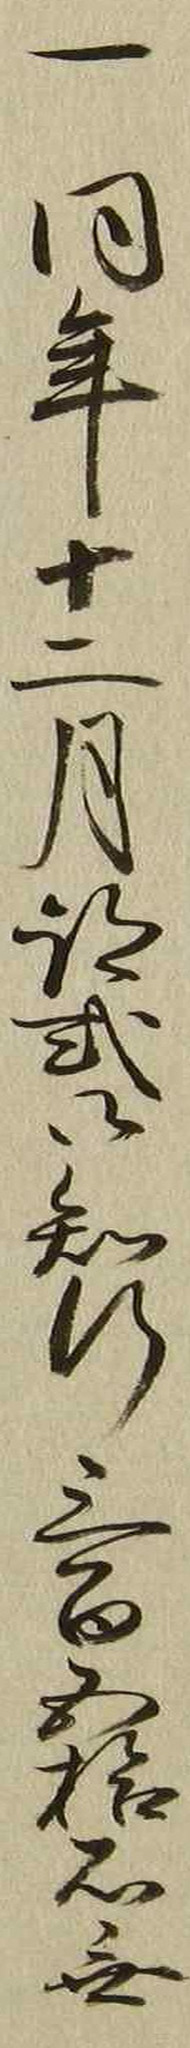一同年十二月跡式御知行三百五拾石無
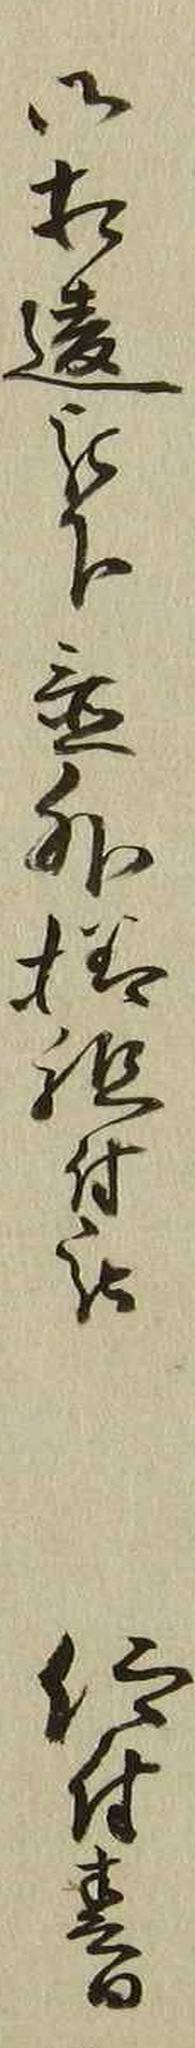御相違被下置外様組付被仰付春日
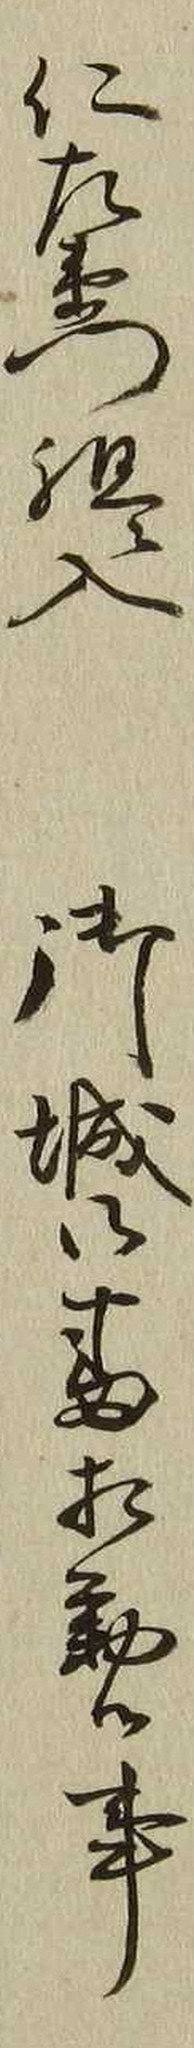仁左衛門組ニ入御城御番相勤候事
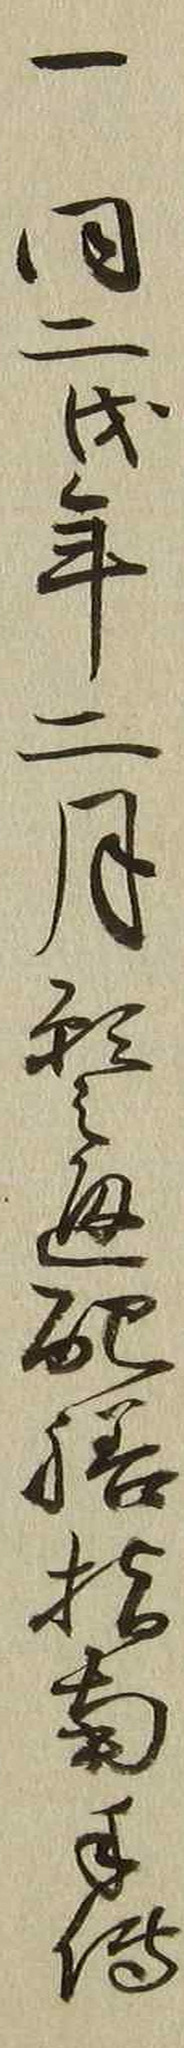一同二戌年二月願之通配膳指南手伝
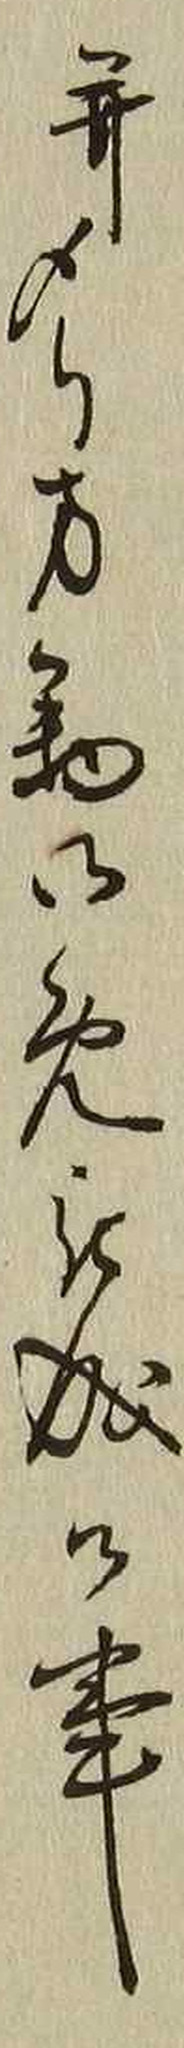幷〆り方勤御免被成候事
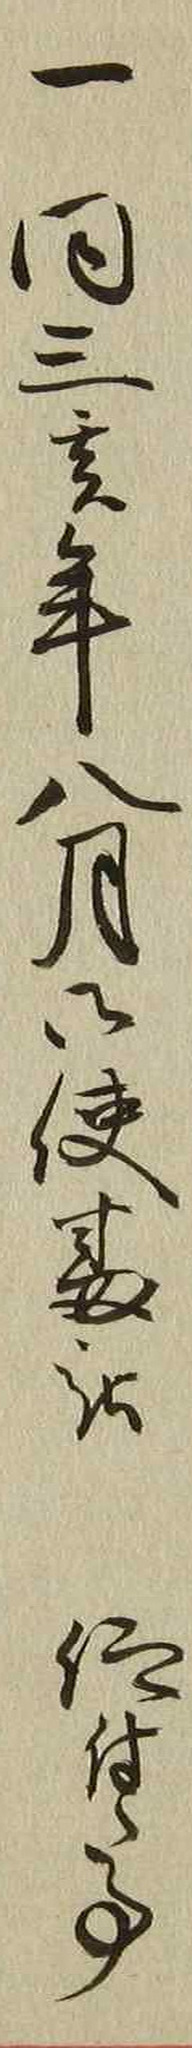一同三亥年八月御使番被仰付候事
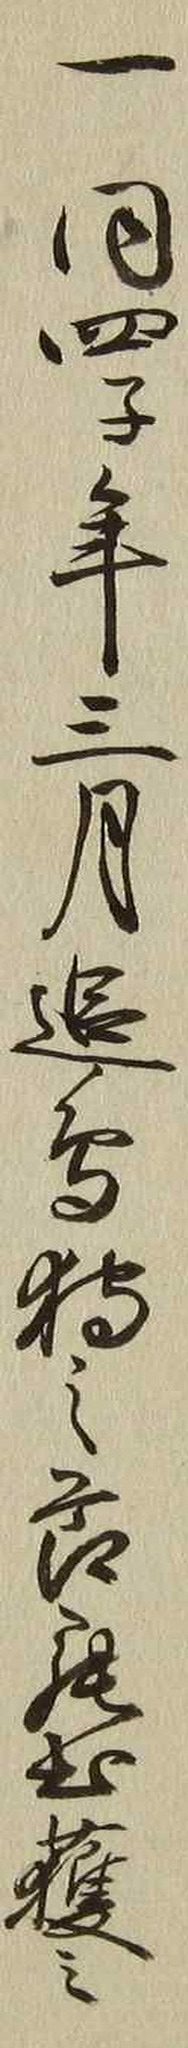一同四子年三月追鳥狩之節罷出獲之
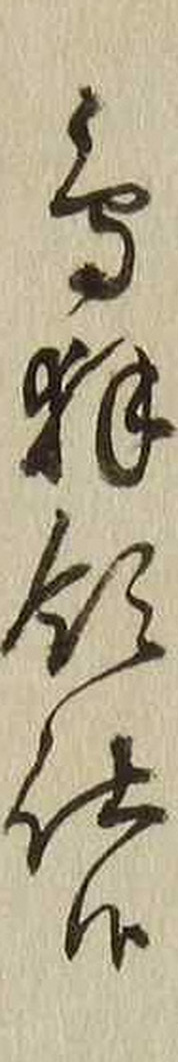鳥拝領仕候
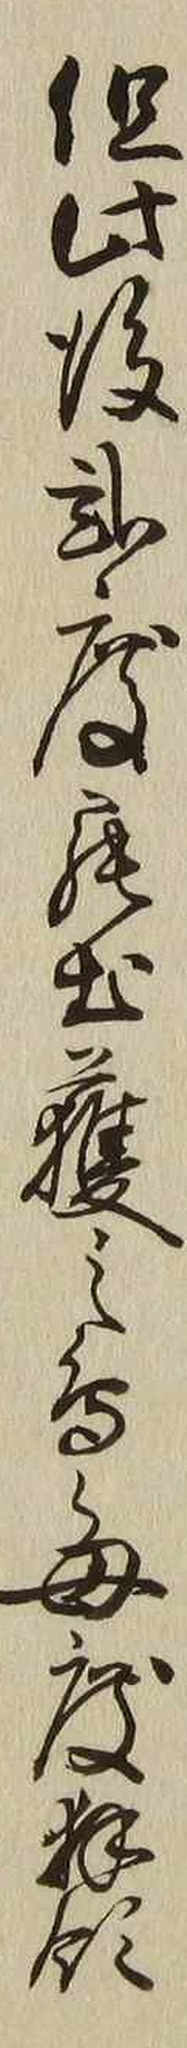但此後弐度罷出獲之鳥毎度拝領
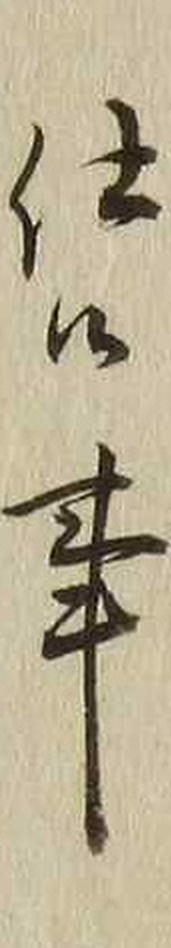仕候事
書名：諸士系譜　巻之60　と之部3
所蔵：会津若松市立会津図書館
